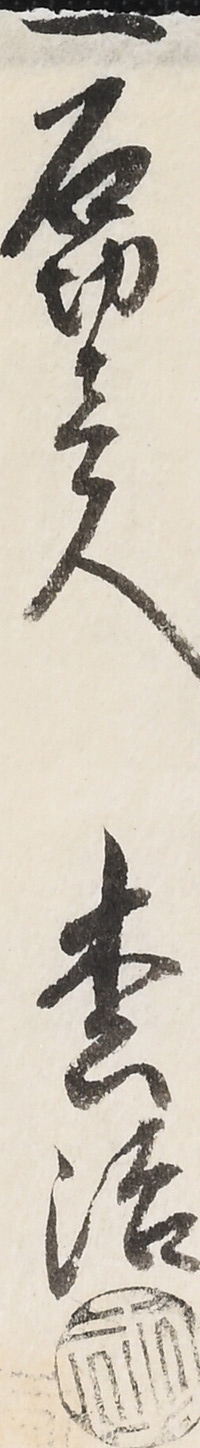一石切壱人松治㊞
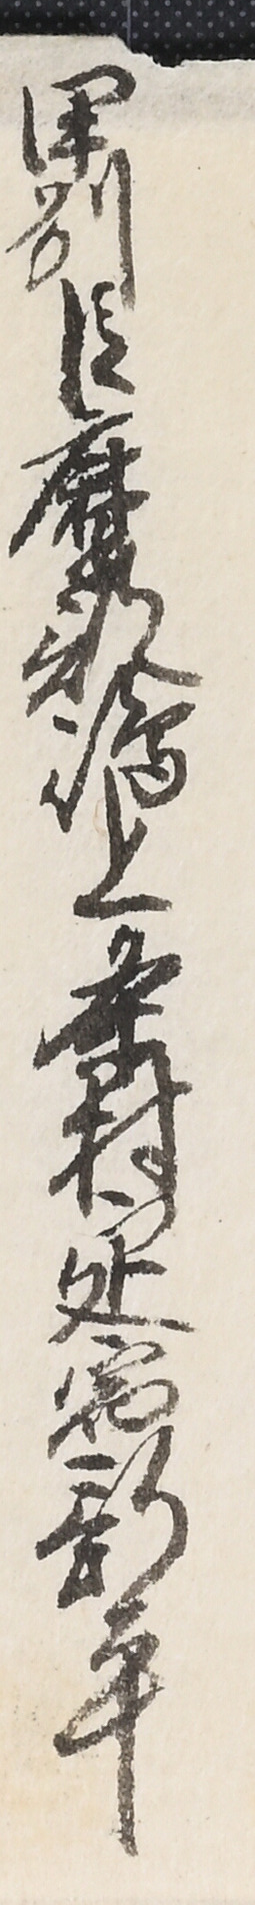甲州巨摩郡島上条村定宿新平
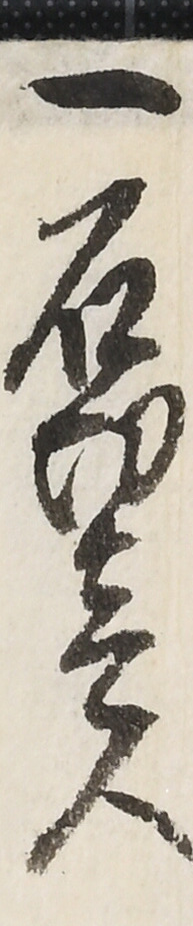一石切壱人
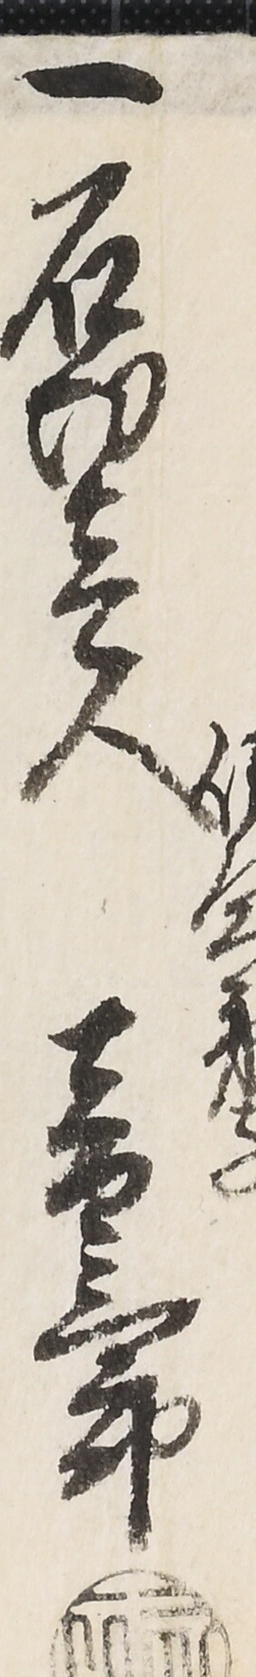一石切壱人音三郎㊞
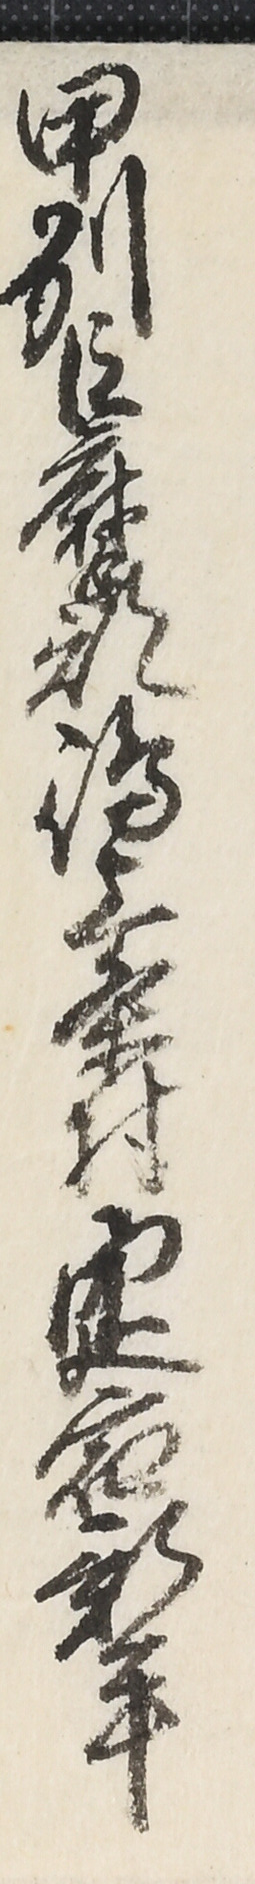甲州巨摩郡島上条村定宿新平

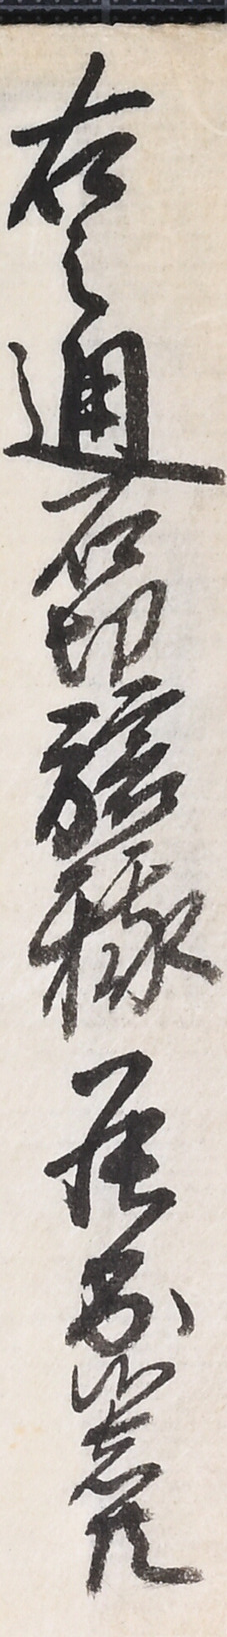右之通石切旅稼罷出候者共
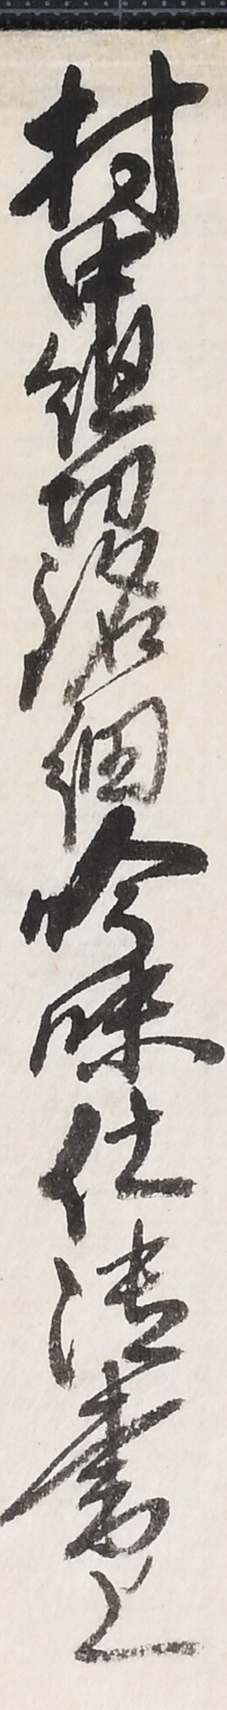村中組切銘細吟味仕御書上
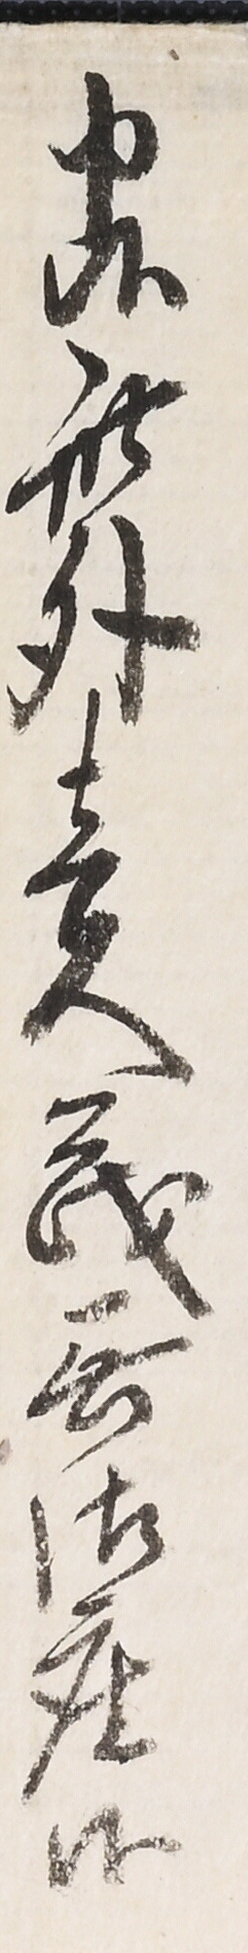申候此外壱人も無御座候
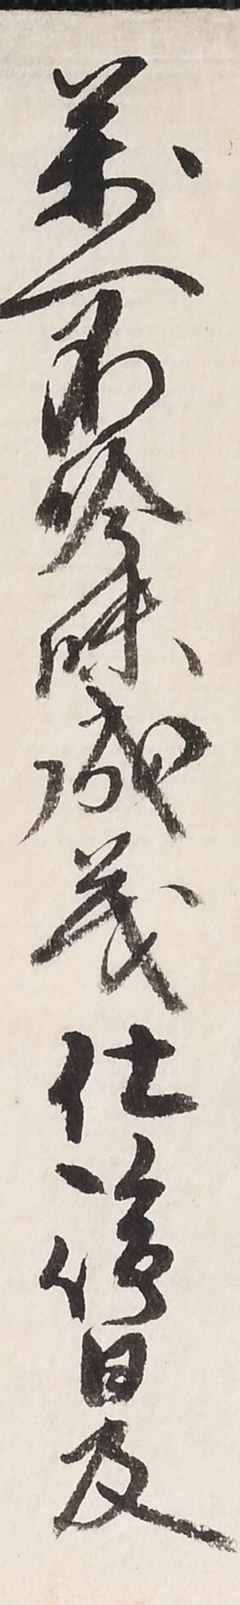万一不吟味成義仕後日及
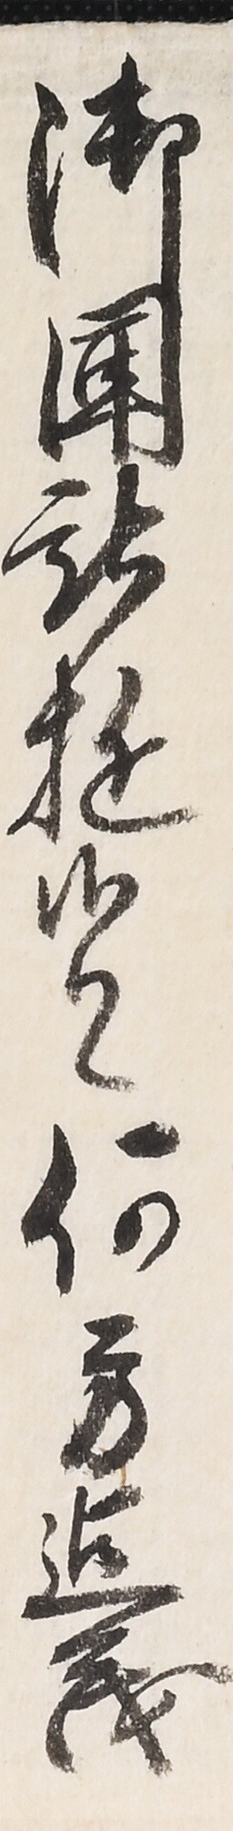御国被遊候ハヽ何方迄も
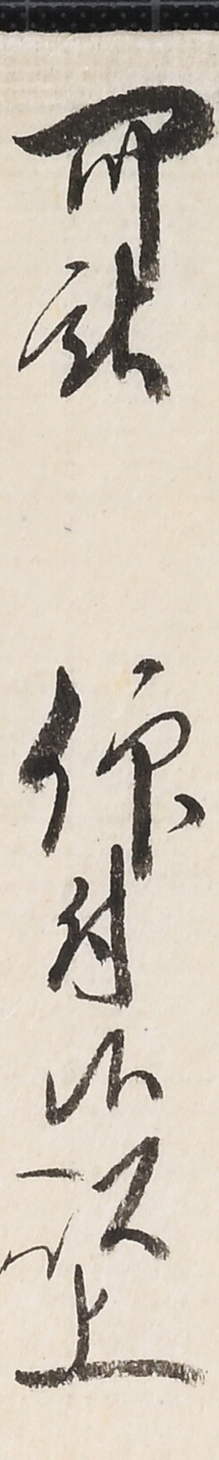可被仰付候以上
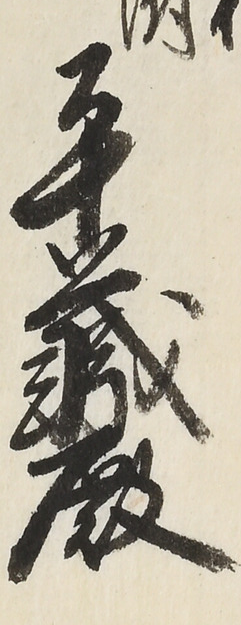平蔵殿
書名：万延二辛酉年正月石切名前書上帳
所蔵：伊那市立高遠町図書館・合同会社AMANE
